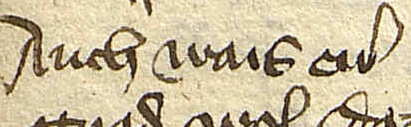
Auch wais ew*
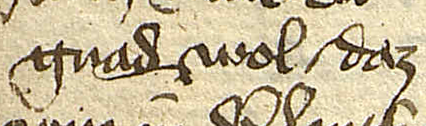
gnad wol / daʒ
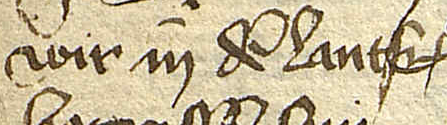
wir in d* lantfr*
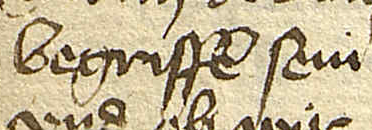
begriffe* ſein
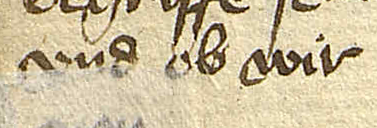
vnd ob wir
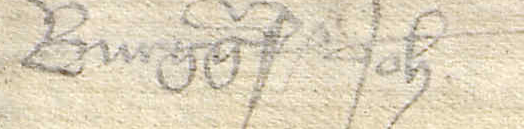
Burgg*f Ioh*.
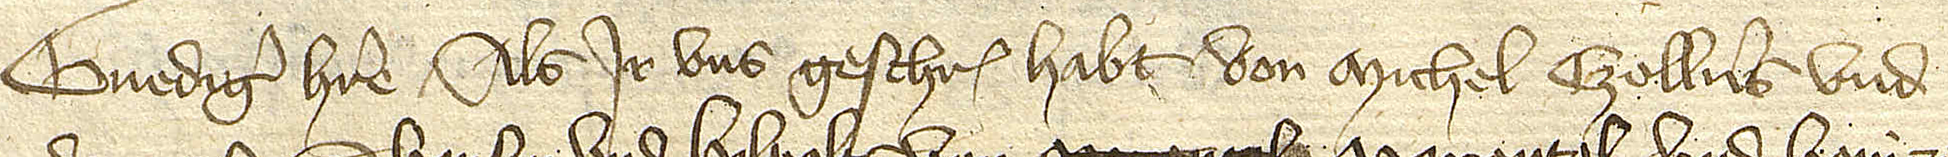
Gnedig* hr*e / Als Ir vns geſchr* habt von Michel Cʒölln*s vnd
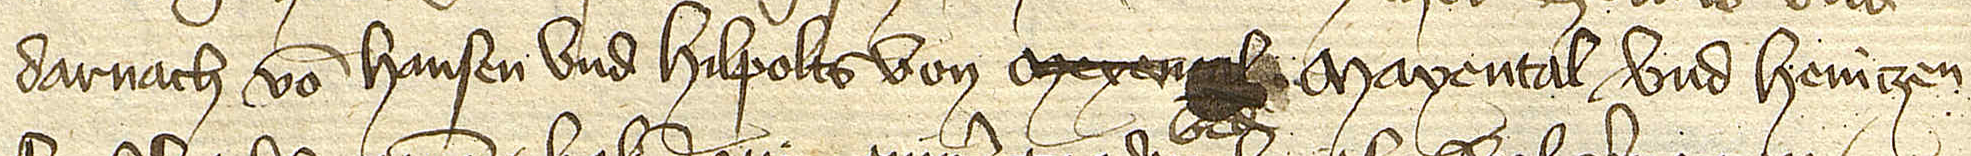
darnach vo* hanſen vnd hilpolts von Meyental . Mayental / vnd heincʒen
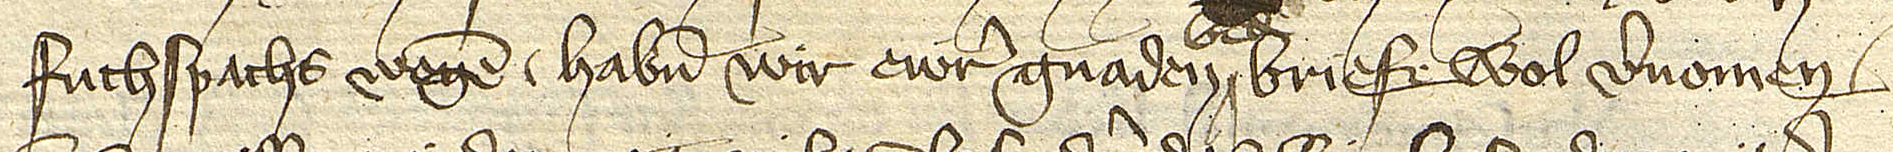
fuchſpachs wege* / habn* wir ewr* gnaden briefe wol v*nomen /
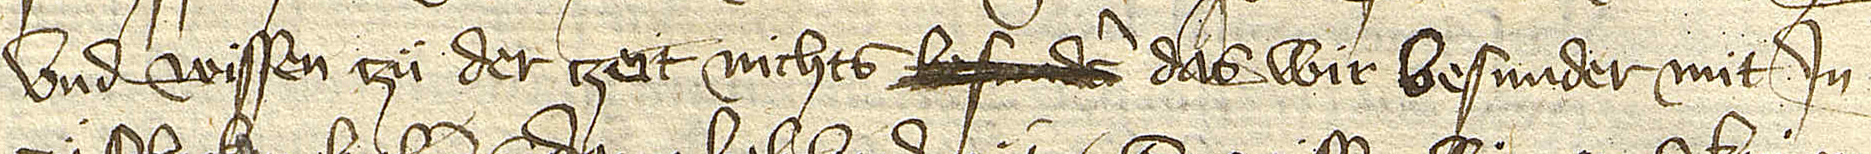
vnd wiſſen cʒü der cʒeit nichts beſunds* das wir beſunder mit In
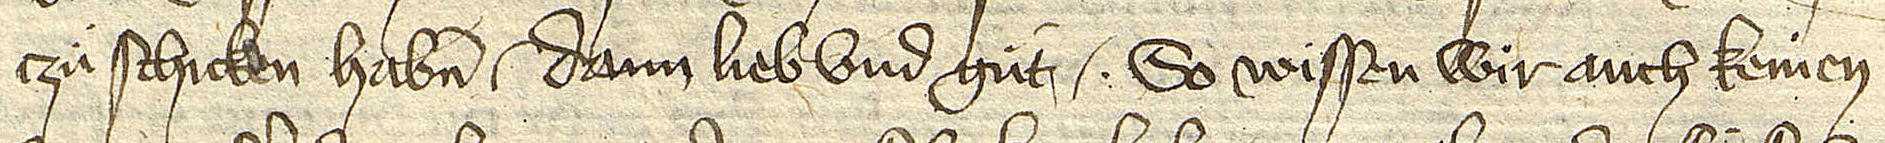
cʒü ſchicken habn* / dann lieb vnd güt / . So wiſſen wir auch keinen
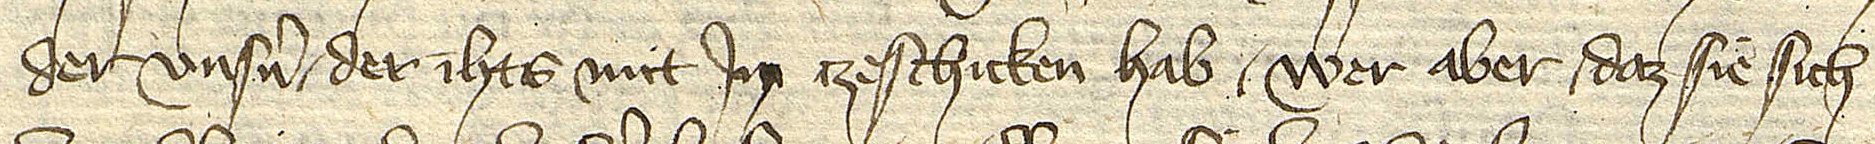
der vnſn* / der ichts mit In cʒeſchicken hab / wer aber / daʒ ſie ſich
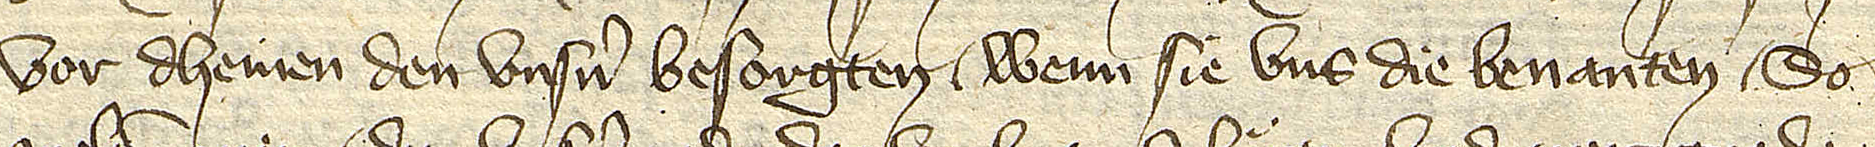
vor dheien den vnſn* beſorgten / wenn ſie vns die benanten / So
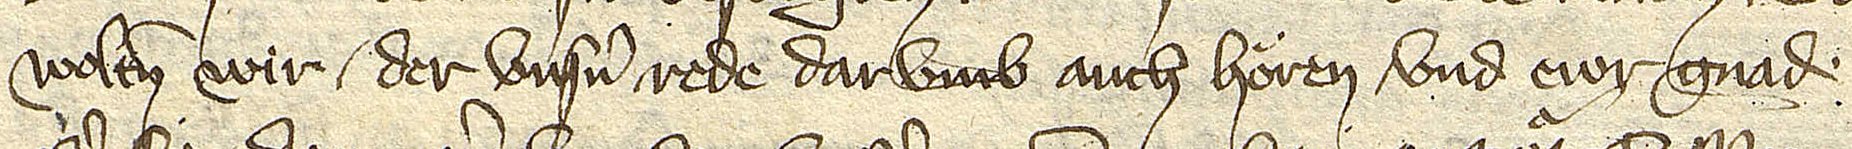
woltn* wir / der vnſn* rede darvmb auch hören / vnd ewr gnade
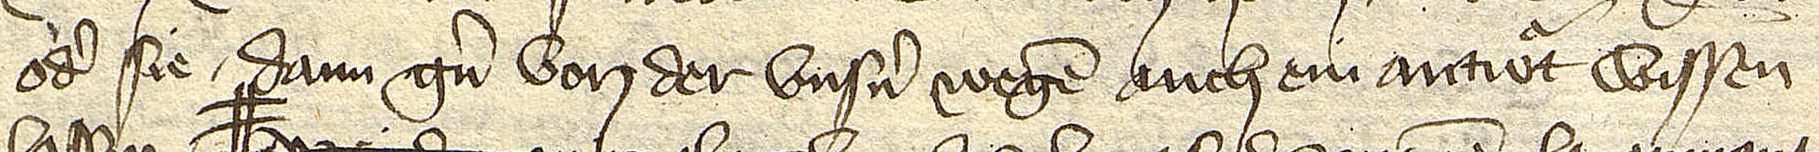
od* ſie / dann gn* von der vnſn* wege* auch ein antw*t wiſſen
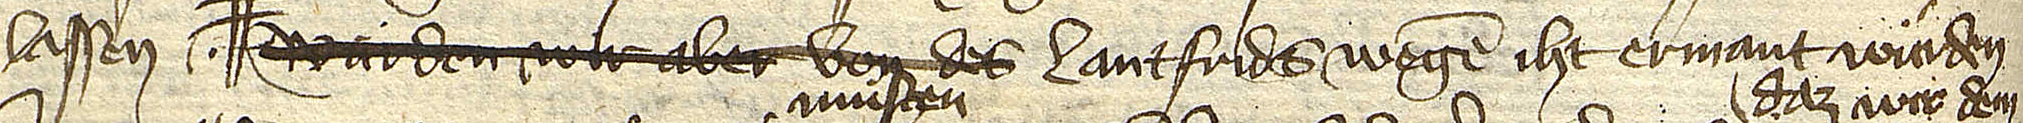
laſſen würden wir aber von des lantfrids wege* iht ermant würden
